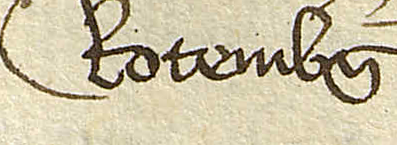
Rotemb*g
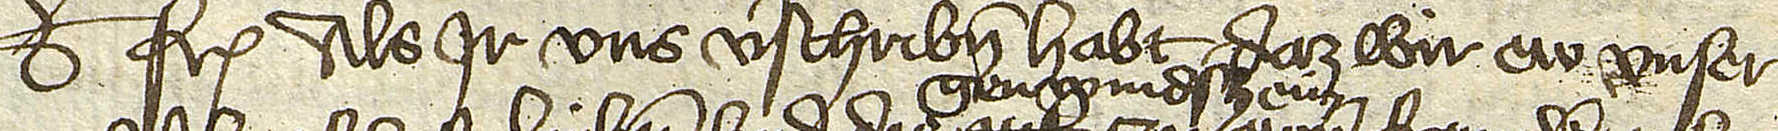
L* fr* Als Ir vns v*ſchribn* habt / daʒ wir ew vnſer
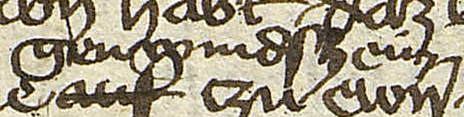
gen windſheim
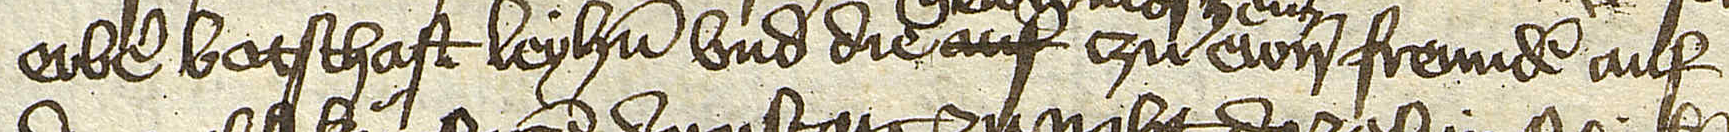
erbe* botſchaft leyhn* vnd die auf cʒu ewn* freunde* auf
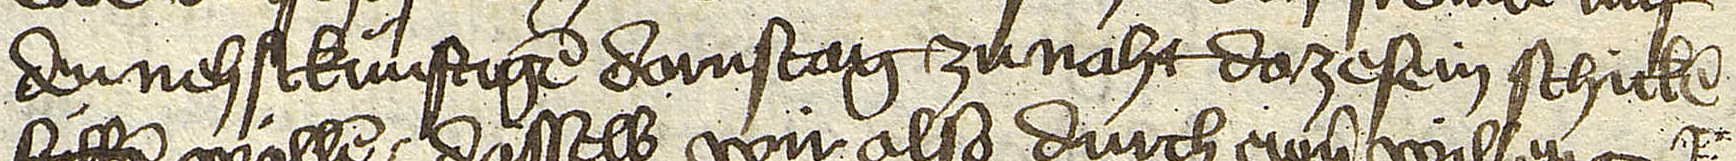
den nehſtkünftige* dornſtag cʒu naht docʒeſein ſchicke*
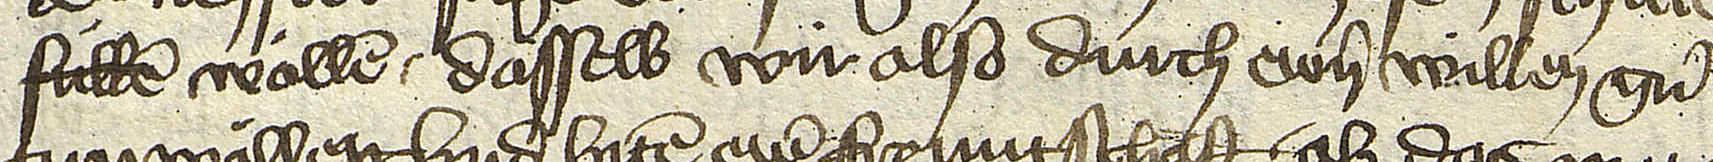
ſülle* wölle* / daſſelb wir alſo durch ewn* willen gn*
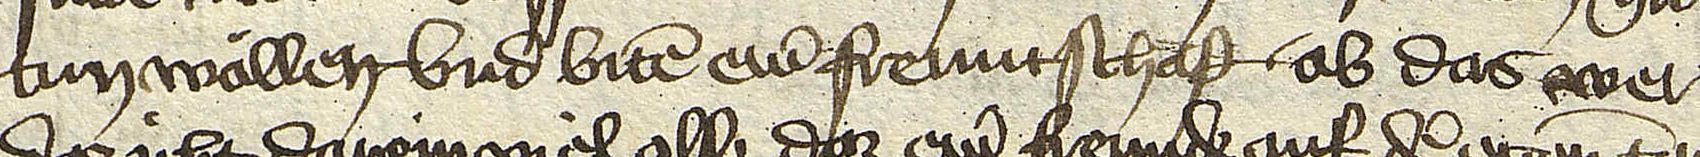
tun wöllen vnd bite* ew* freuntſchaft / ob das wer
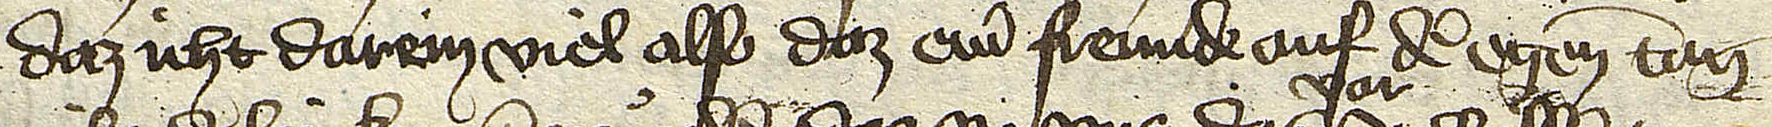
daʒ icht darein viel alſo daʒ ew* freunde auf d* egen* tag
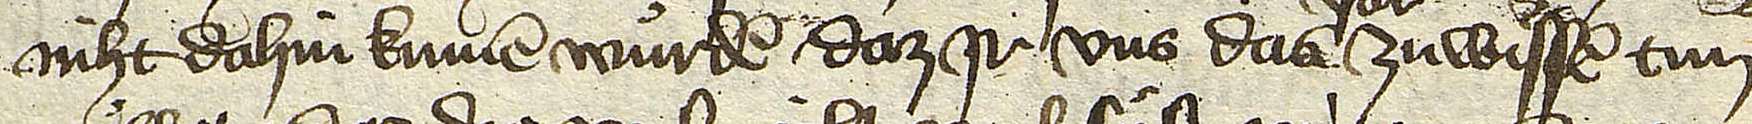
niht dahin kume* würde* / daʒ Ir vns das cʒuwiſſe* tun
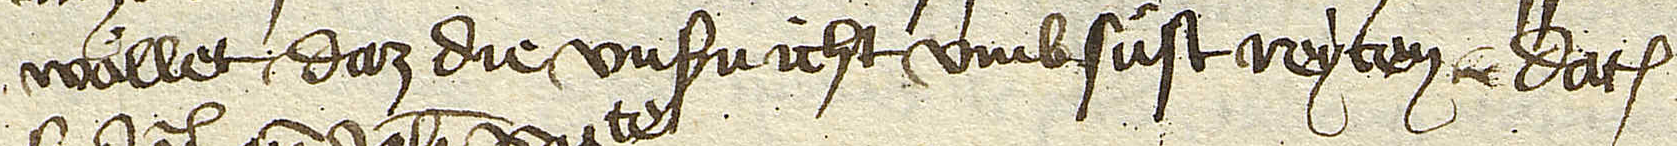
wöllet / daʒ die vnſ*n icht vmbſüſt reyten / dat*
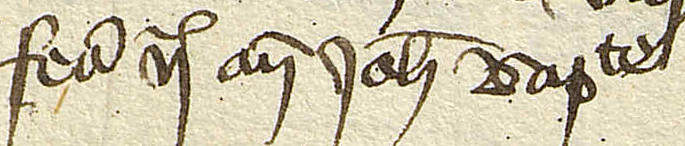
fea* ii* an* Ioh* Bap*
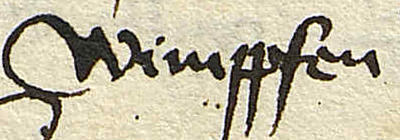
wimppfen
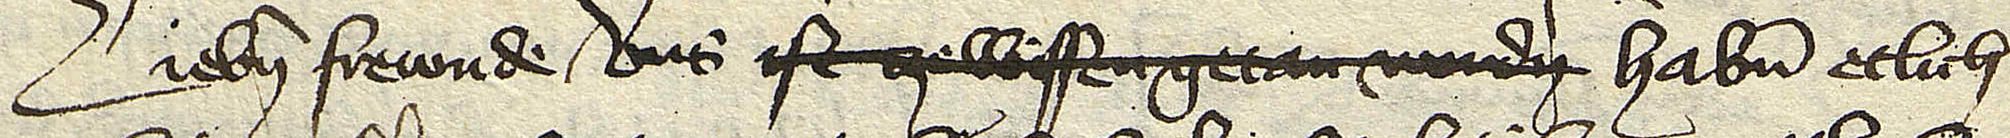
Liebn* frewnde / Vns iſt cʒewiſſen getan wordn* habn* etlich
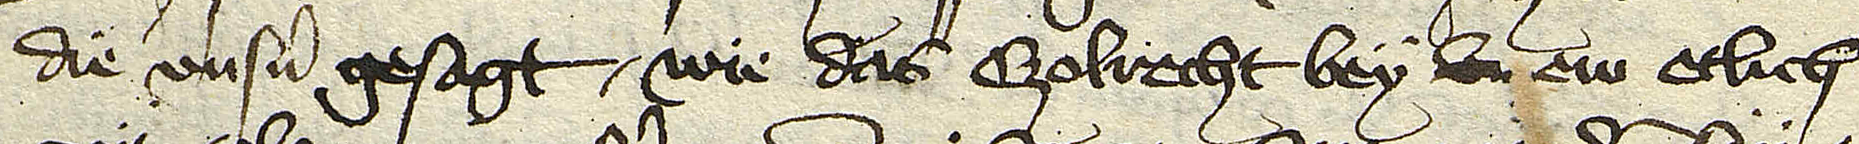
die vnſn* geſagt / wie das Cʒolrecht bey v ew etlich
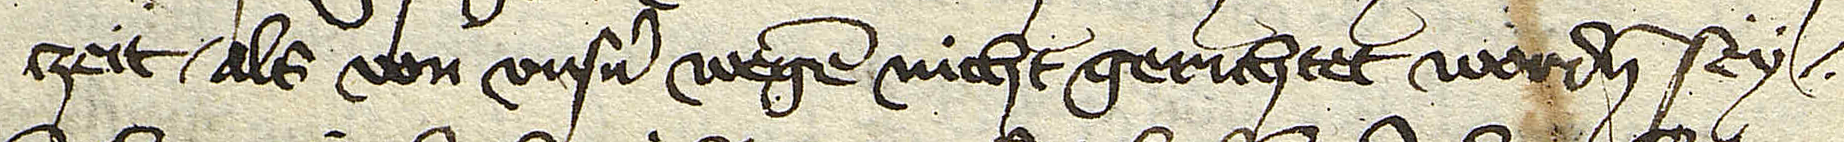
cʒeit / als von vnſn* wege* nicht gerichtet wordn* ſey / .
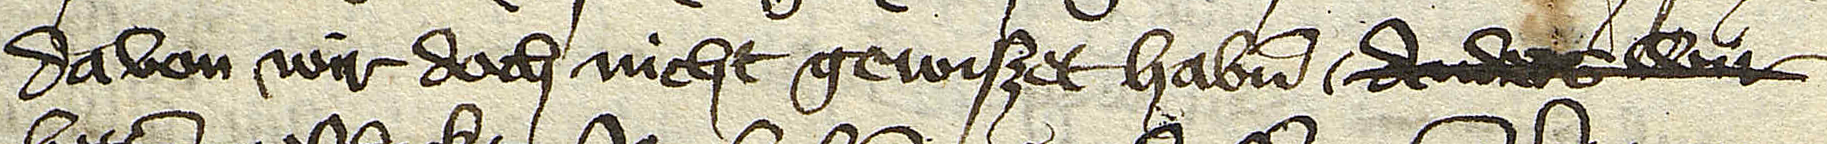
davon wir doch nicht gewiſʒet habn* / Anders wir
